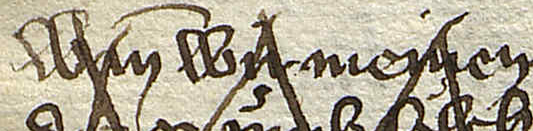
Wan* wir meinen
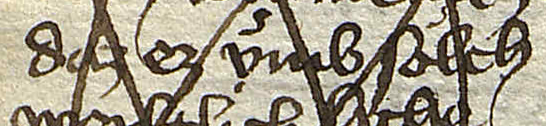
daʒ eʒ v̈mb ſölch
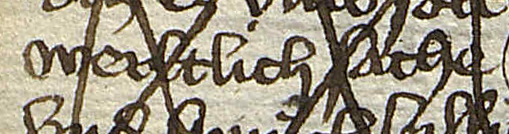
werltlich ſache
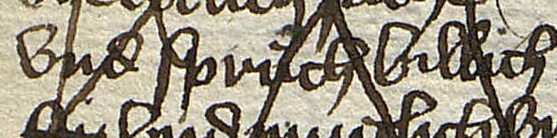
vnd ſprüch billich
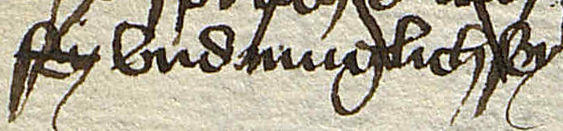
ſey vnd muglich ſey
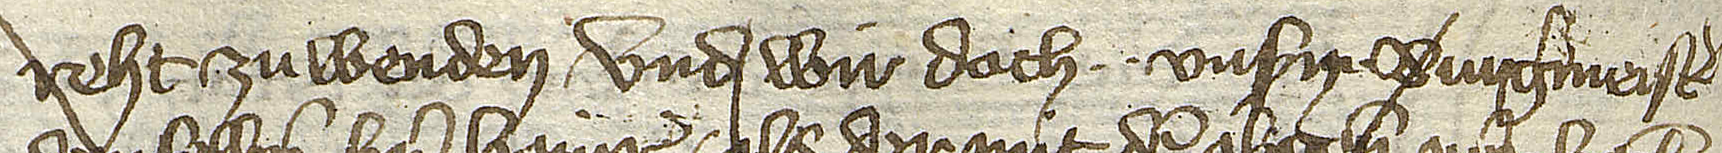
reht cʒu wenden / Vnd wir doch ~ vnſ*m Burg*meiſt*
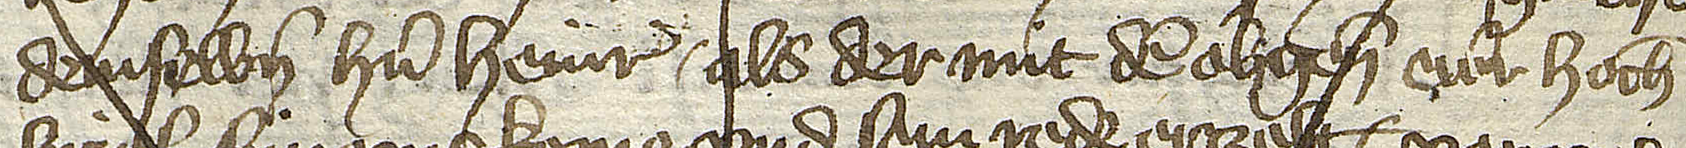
demſelbn* hn* heinr* / als der mit d* obgen* ew*r hoch*
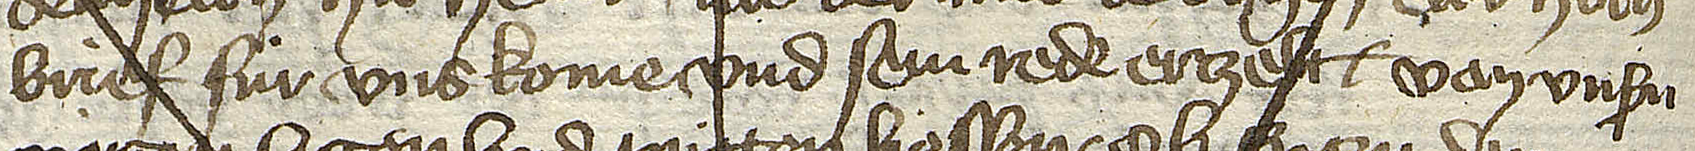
brief für vns kome vnd ſein rede ercʒelt / von vnſ*n
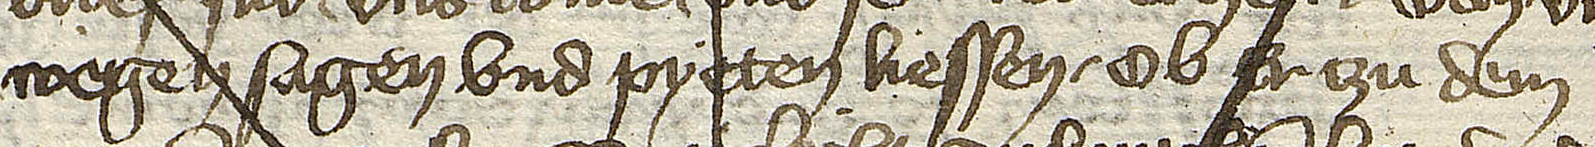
wegen ſagen vnd pyeten lieſſen / Ob Er cʒu dem
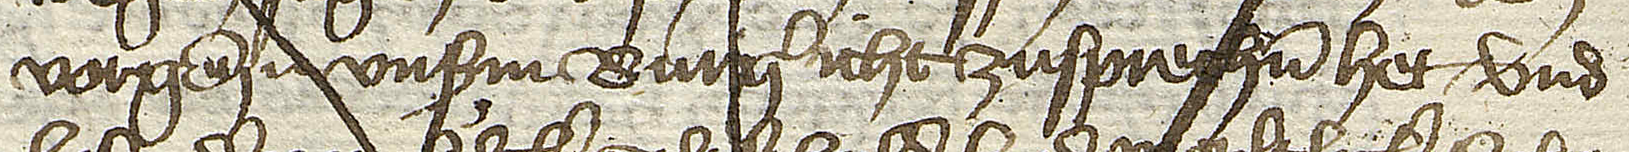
vorgen* ~ vnſ*m Burg* icht cʒuſprechn* het / vnd
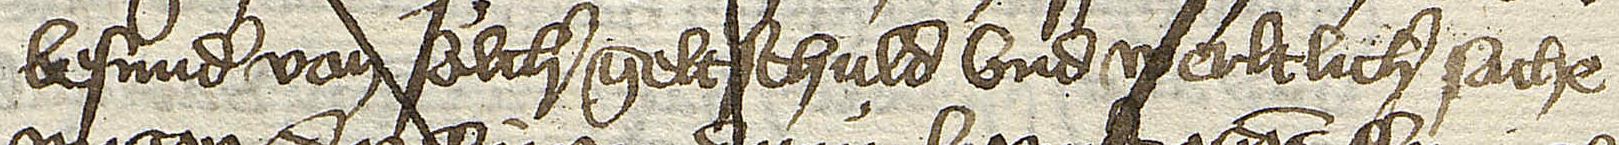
beſund* von ſölch* gelt ſchuld vnd werltlich* ſache
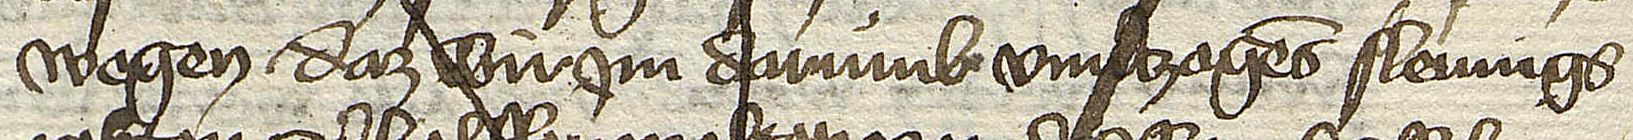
wegen / daʒ wir Im darümb vnu*cʒoge*s ſleunigs
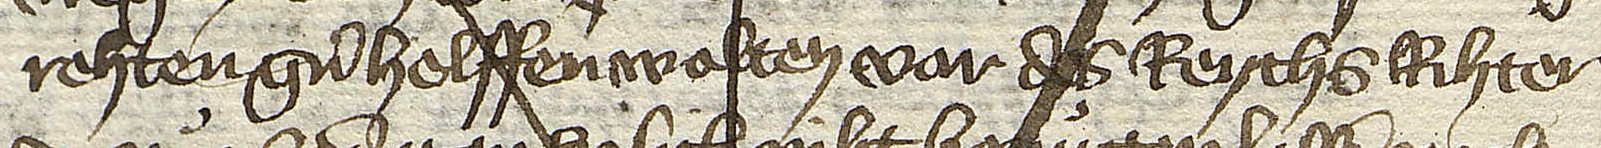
rehten g*n helffen wolten vor des Reichs Rihter
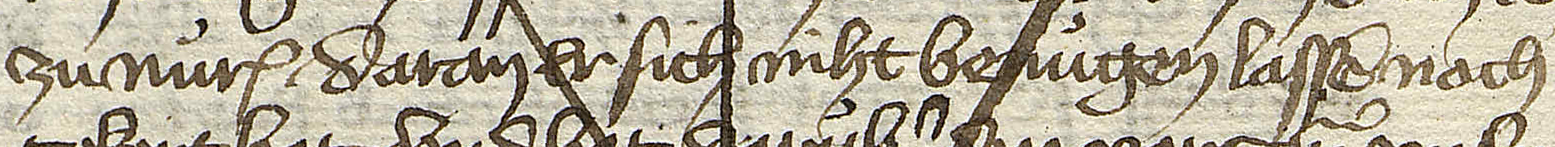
cʒu Nür* / Daran Er ſich niht benügen laſſe* noch
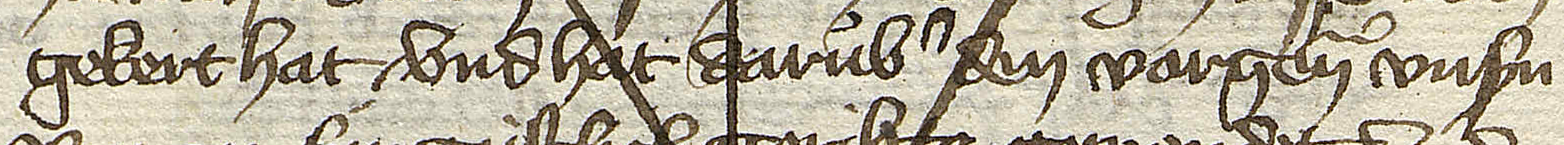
gekert hat / vnd hat darüb* den vorgen* vnſ*n
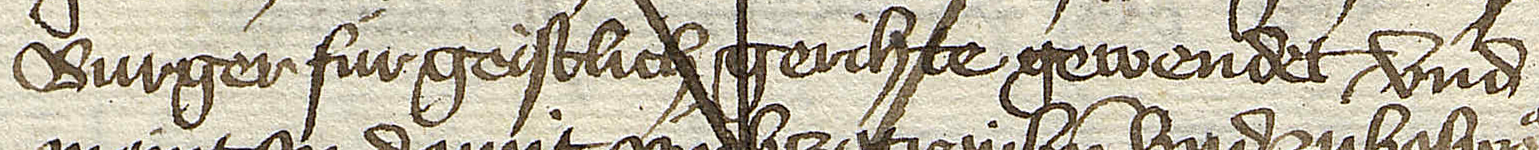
Burger für geiſtlich gerihte gewendet / Vnd
